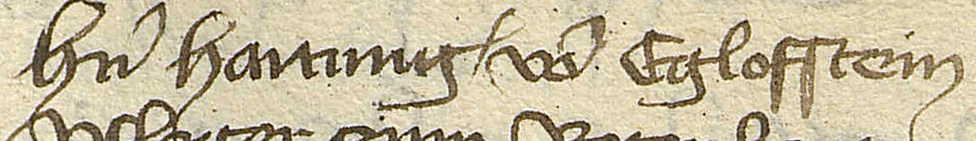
hn* hartung* vo* Eglofſtein
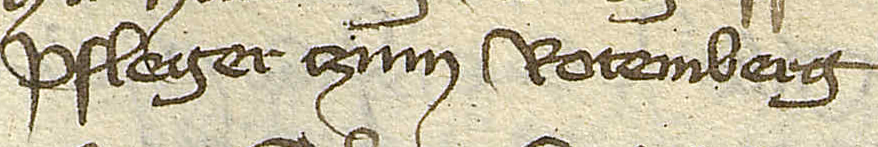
Pfleger cʒum Rotemberg
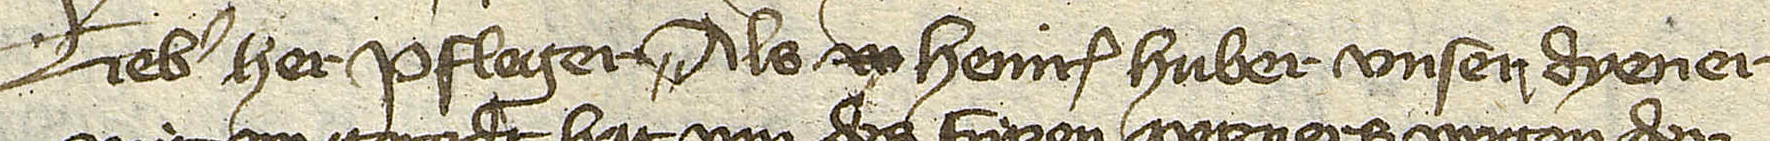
Lieb* her Pfleger / Als w heinr* huber vnſer dyener
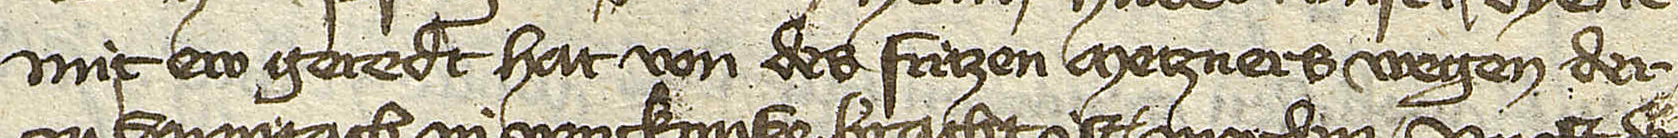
mit ew geredt hat von des fricʒen Mecʒners wegen der
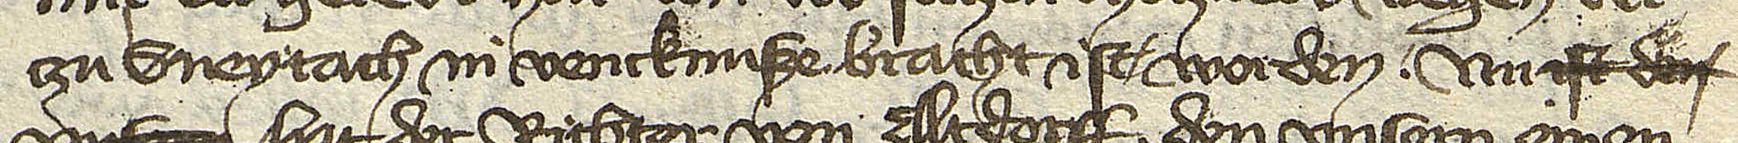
cʒu Sneytach in venknuſʒe braht iſt / worden . Nu iſt den
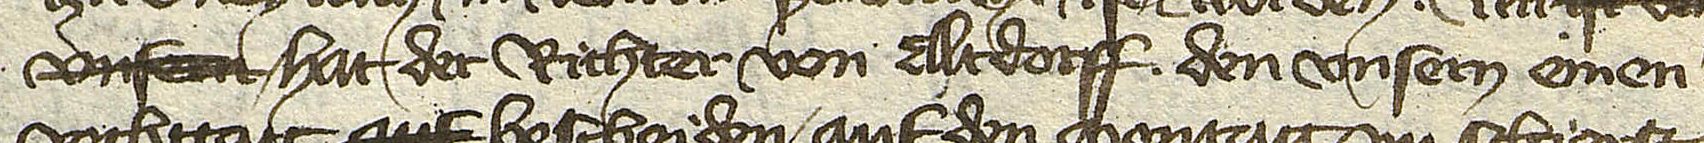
vnſern / hat der Richter von Altdorff . den vnſern einen
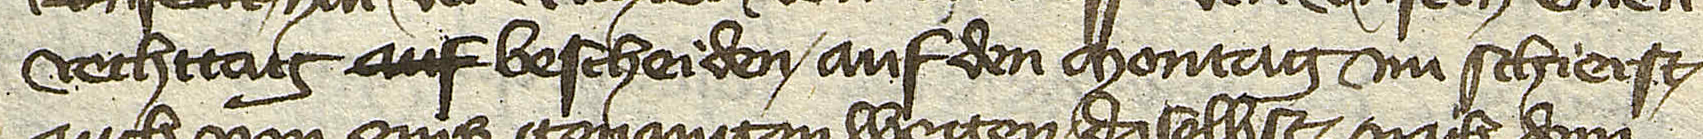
rechttag auf beſcheiden / auf den Montag nu ſchierſt
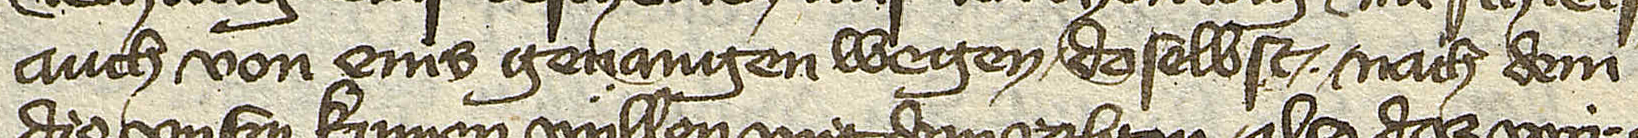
auch von eins geuangen wegen / doſelbſt . / nach dem
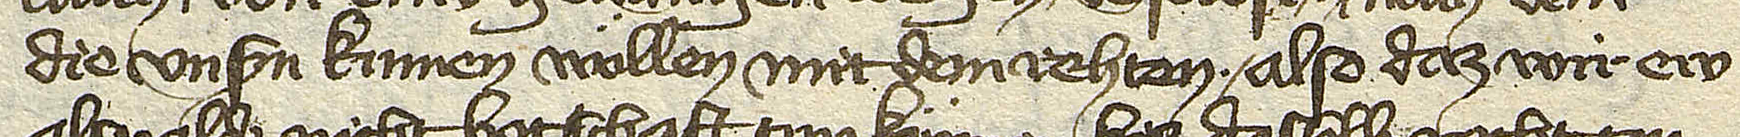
die vnſ*n kumen wöllen mit dem rehten . / alſo daʒ wir ew
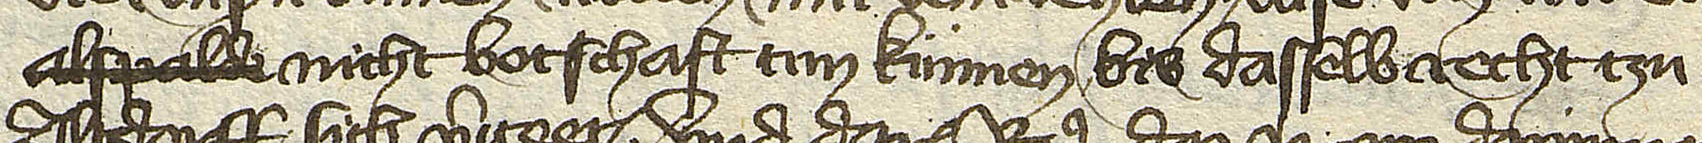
alſpalde nicht botſchaft tun künnen bis daſſelb recht cʒu
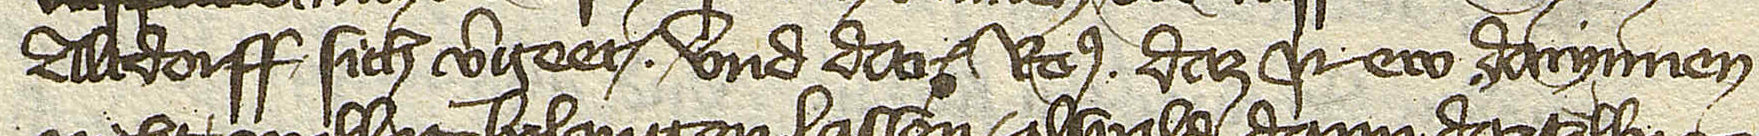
Altdorff ſich v*geet / . Vnd dar* Ro* . daʒ Ir ew darynnen
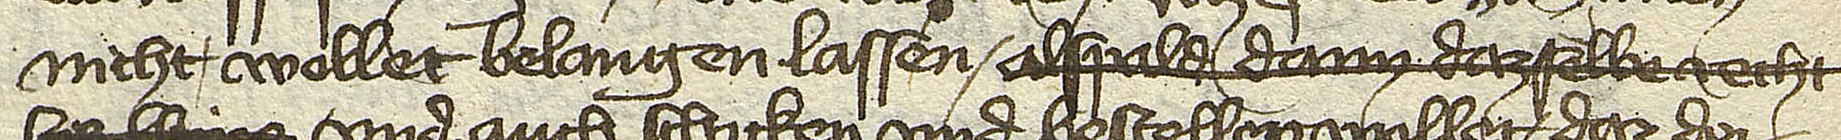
nicht wollet belangen laſſen / alſpald dann daʒſelbe recht
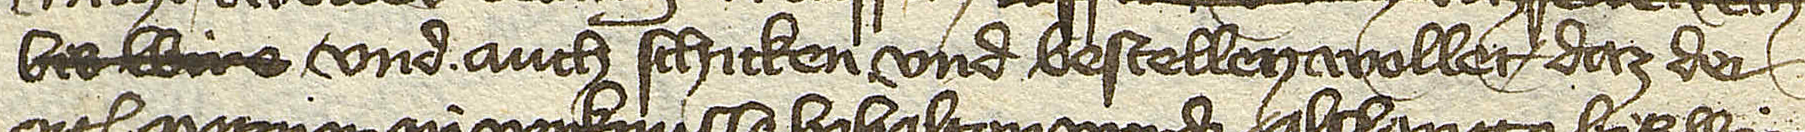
bis wirs / vnd auch ſchicken vnd beſtellen wollet / daʒ der
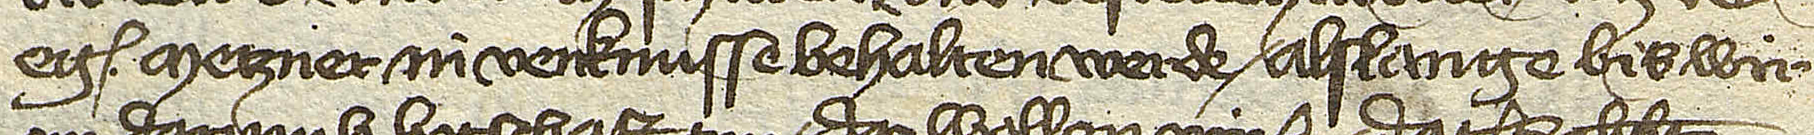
eg* Mecʒner in venknuſſe behalten werde / alſlange bis wir
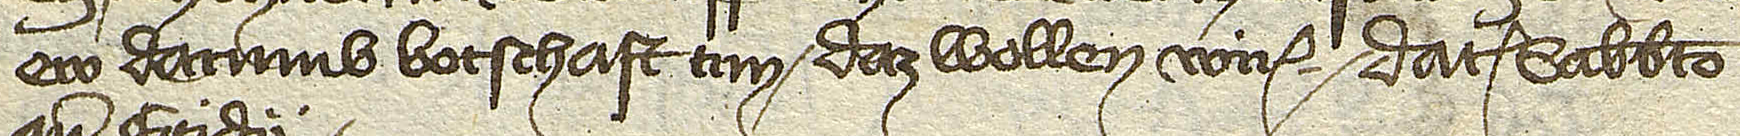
ew darumb botſchaft tun / daʒ wollen wir* / dat* Sabbto*
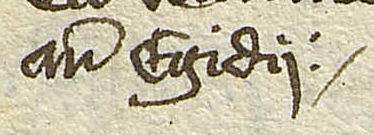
an* Egidii* . /
